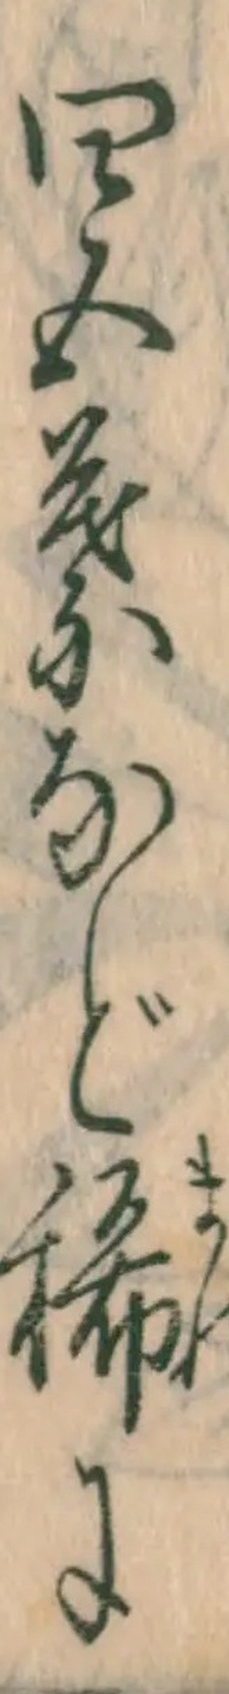四五葉など稀に
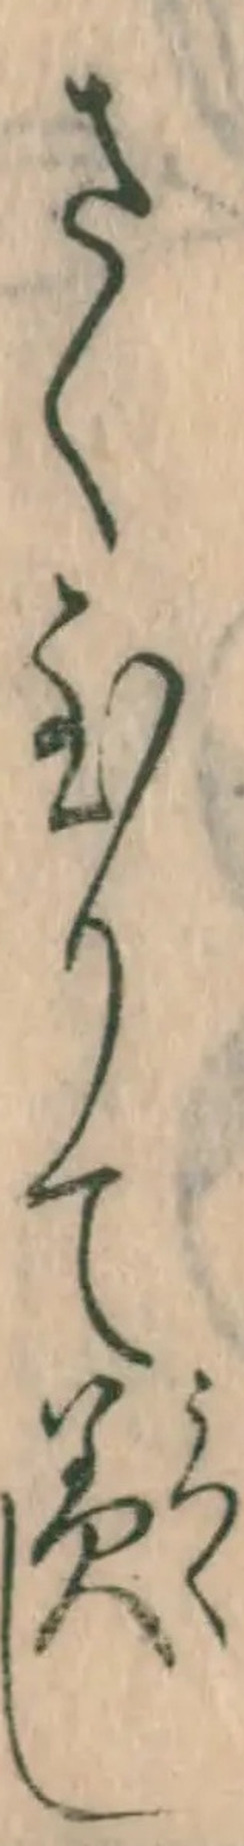さく至りて美し
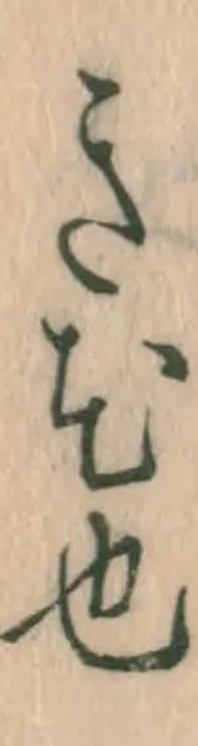き花也
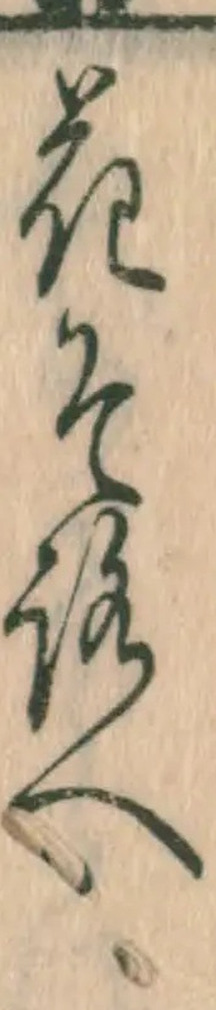花そろへ
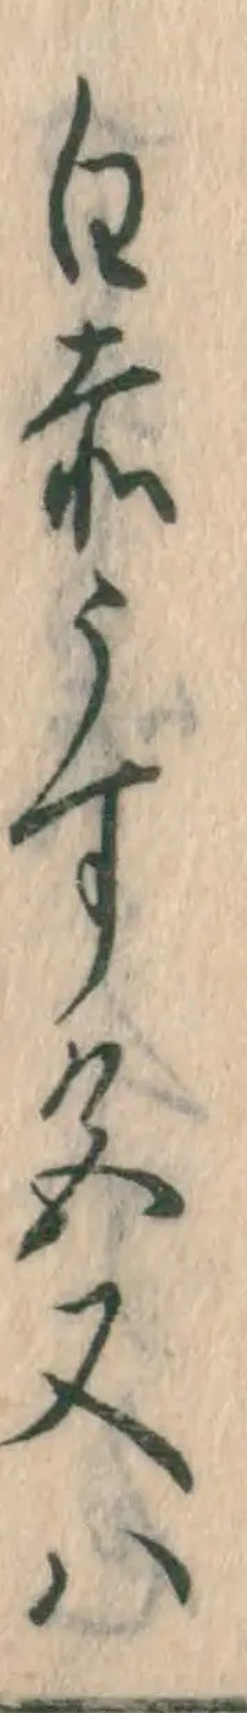白赤うす色又は
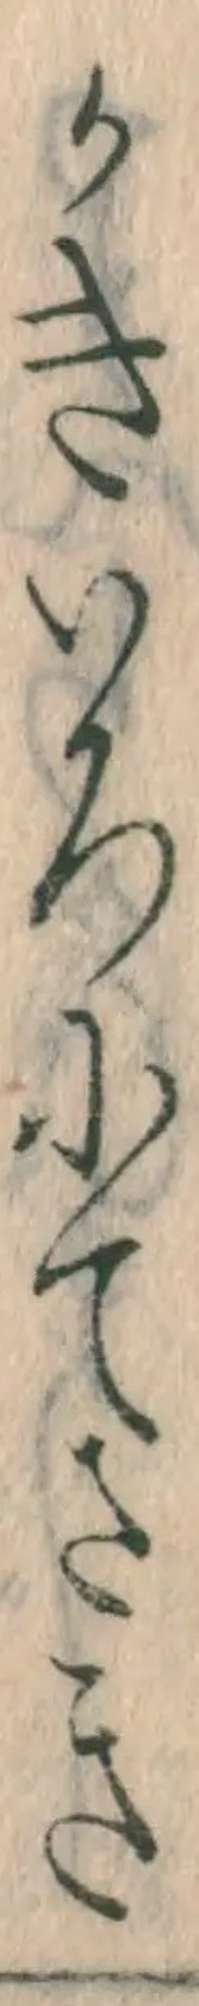かきいろにてさき
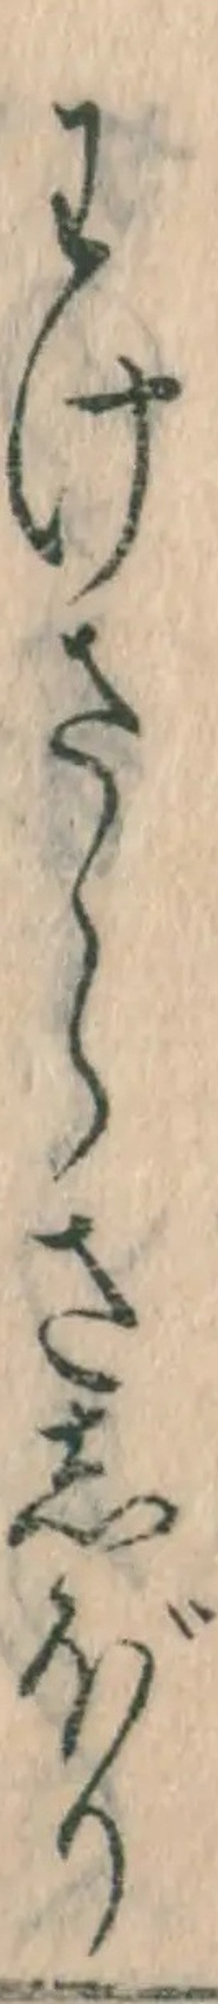わけさらさしぼり

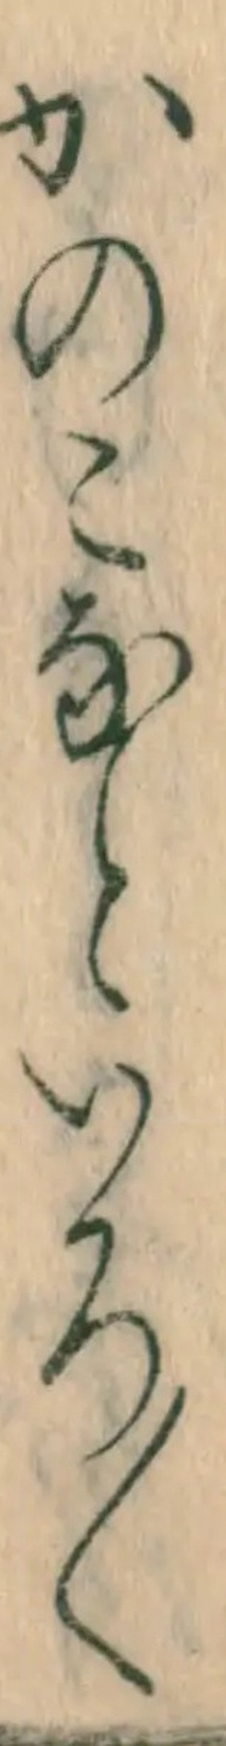かのこなといろ〳〵
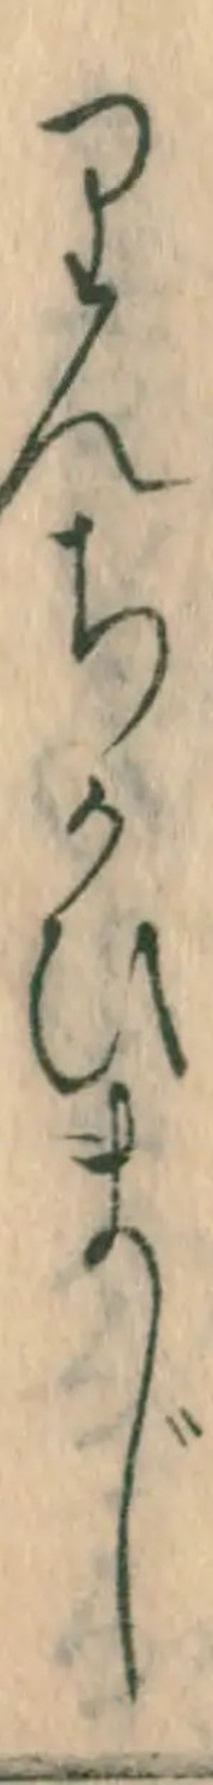りんちかひまじ
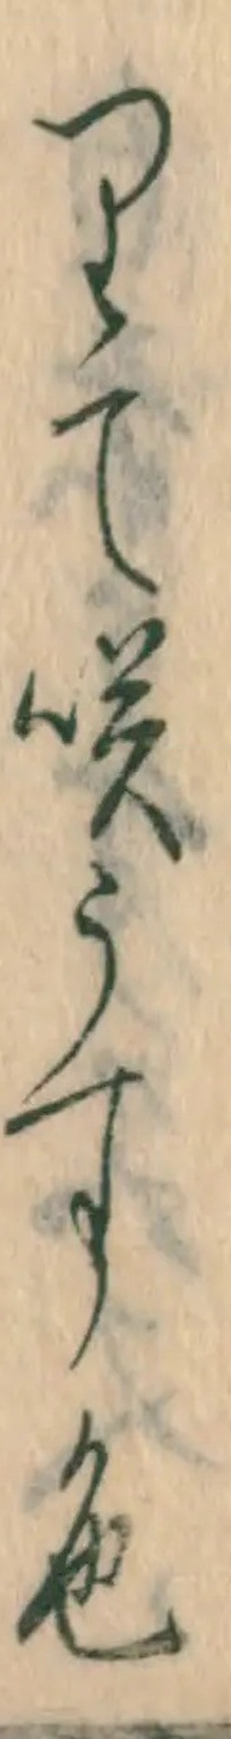りて咲うす色
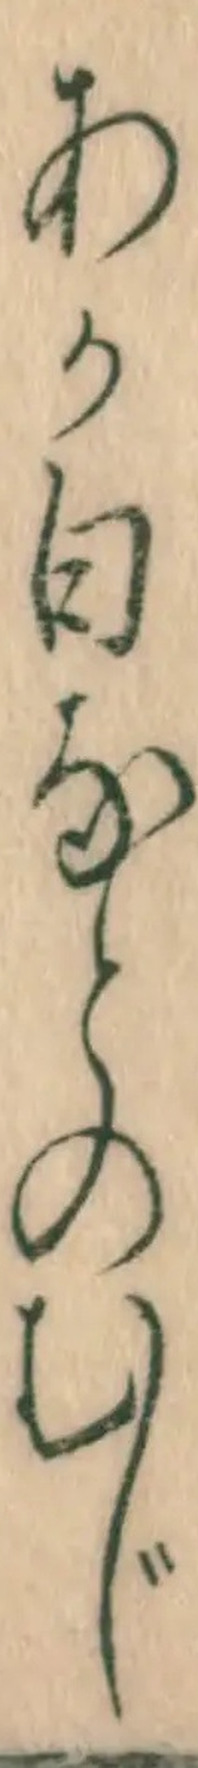あか白なとのむじ
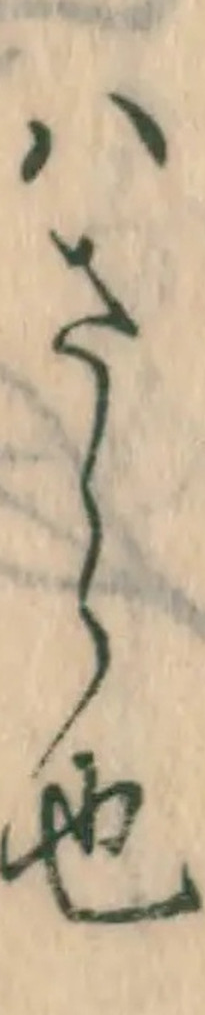はさら也
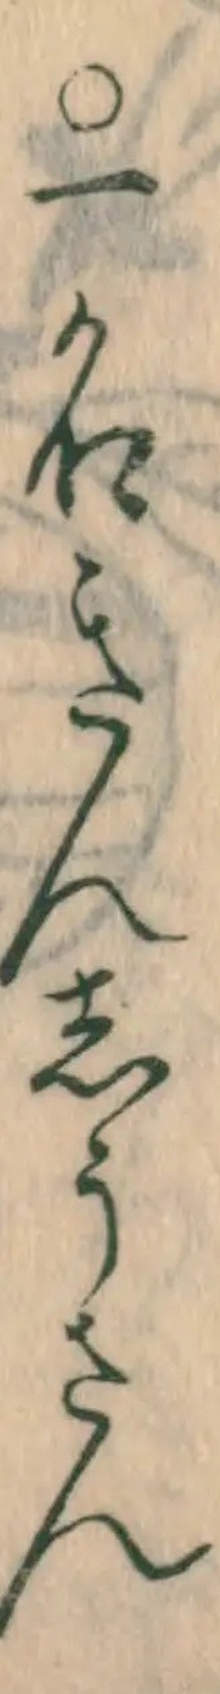○一名きんしうさん
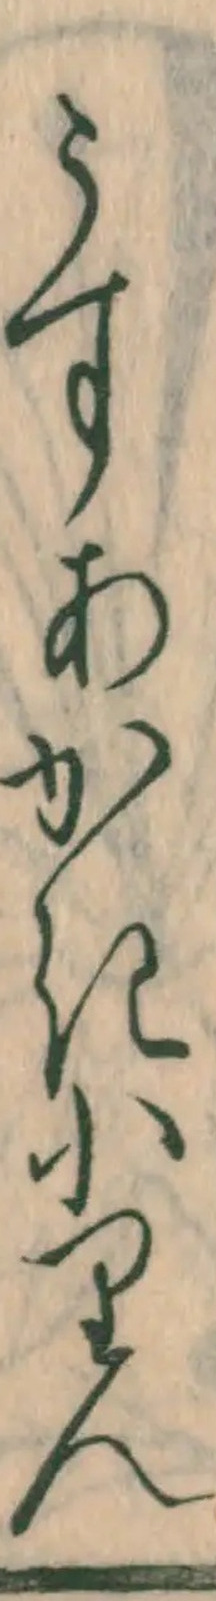うすあかき小りん
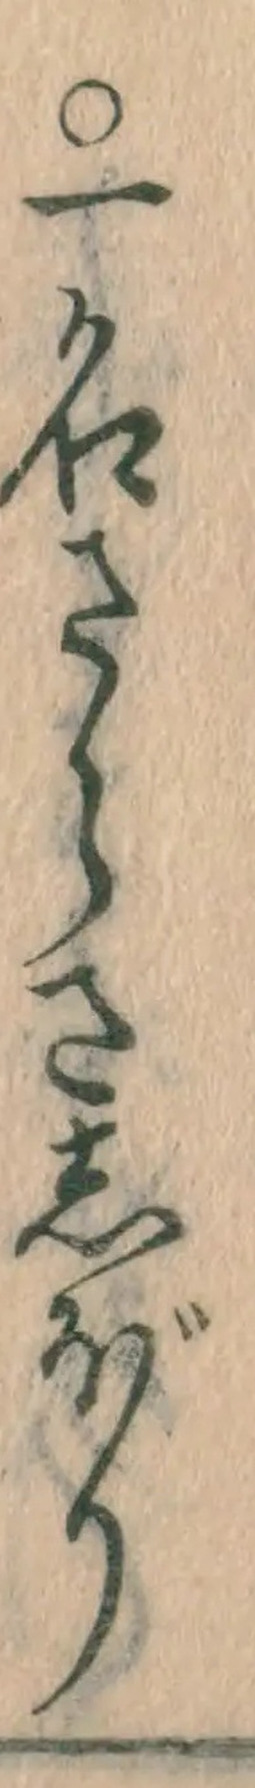○一名さらさしぼり
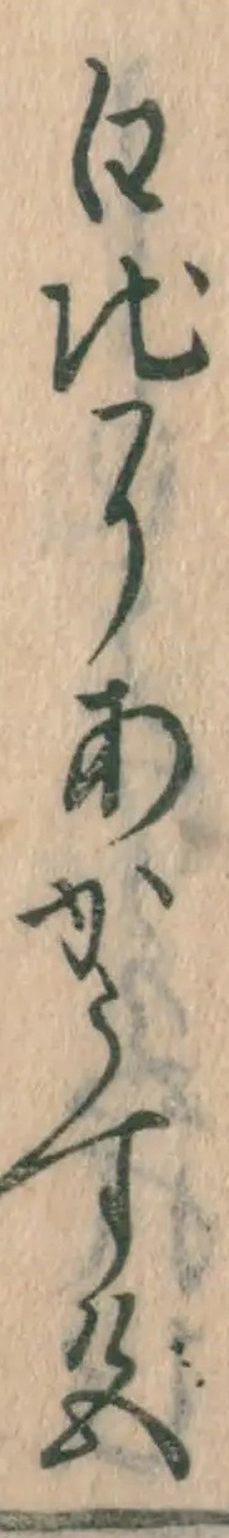白地にあかうす色
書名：錦繍枕 5巻. [4]
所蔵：国立国会図書館 National Diet Library, JAPAN
